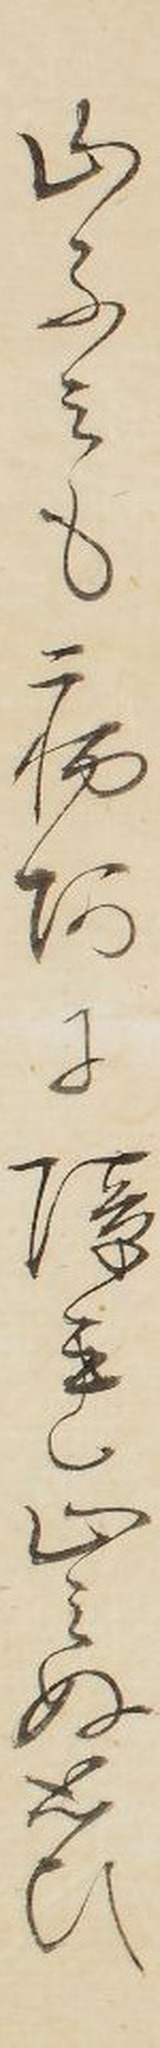山ふみも病阿に障れ山みぬ思ひ
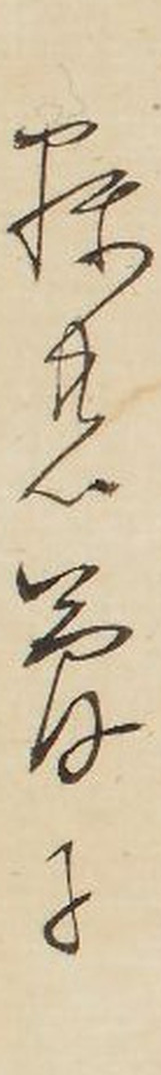寝の夢に

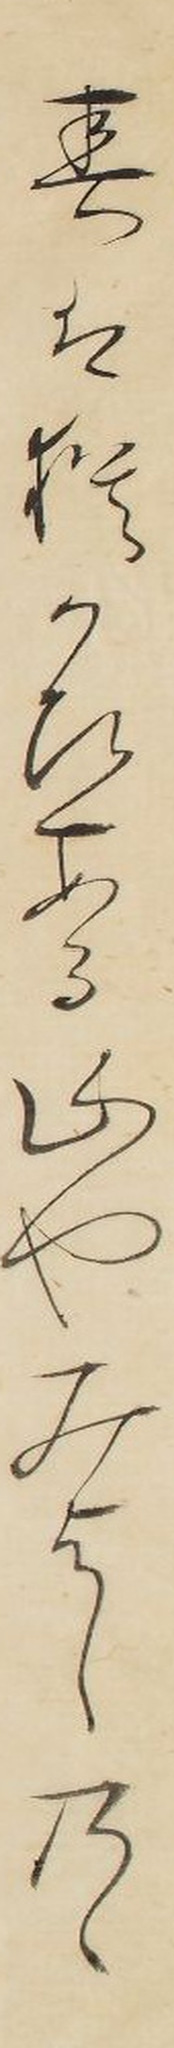春は猶かすある山やみよしのゝ
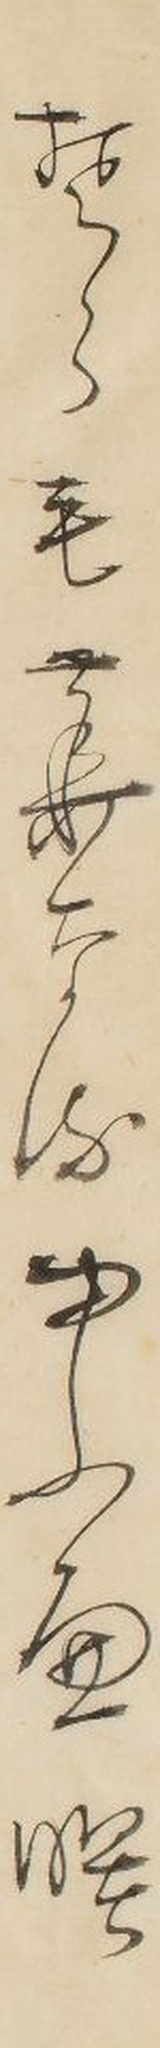そらも華なるゆふへ曙
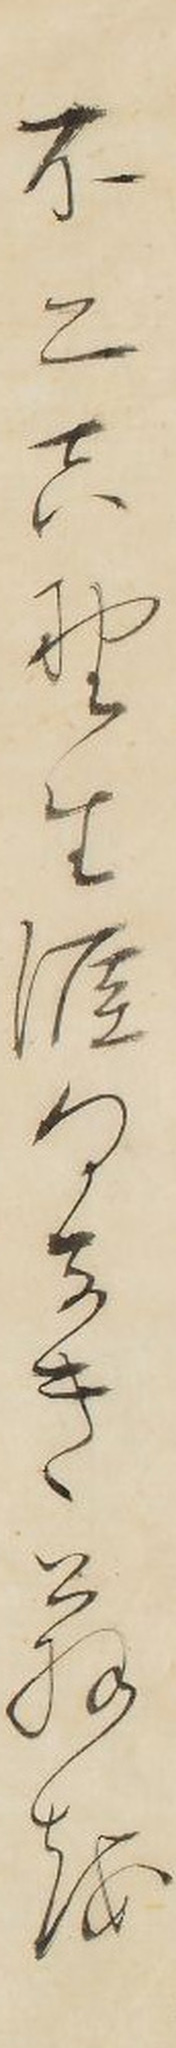不二真野生涯句なき翁を
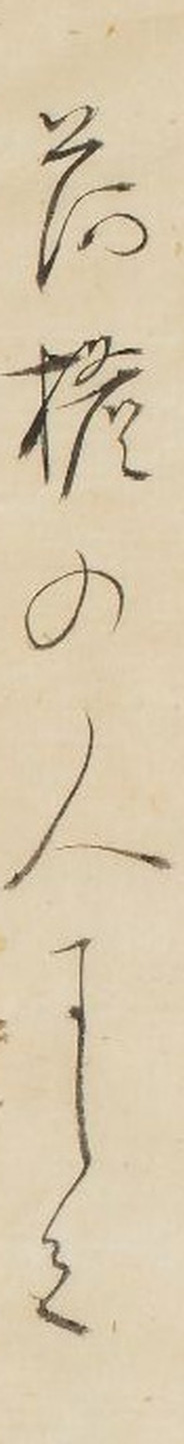荷擔の人にして
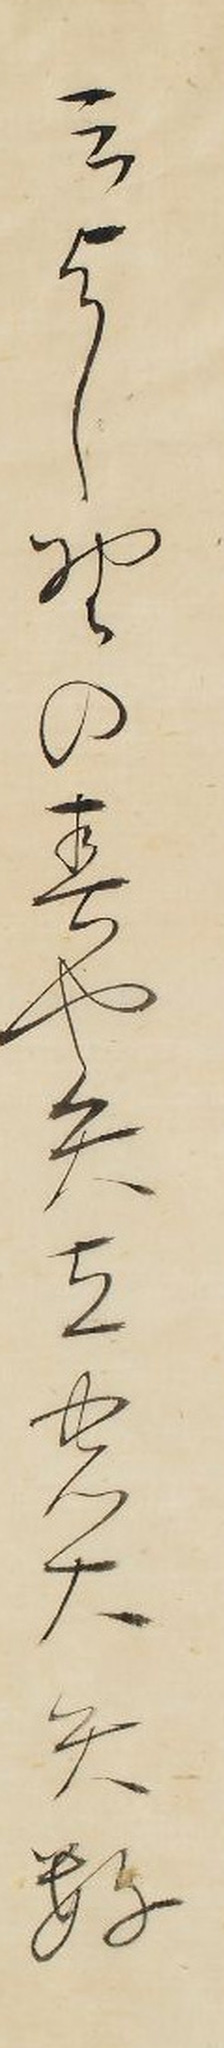みよし野の春や矢立の大矢数
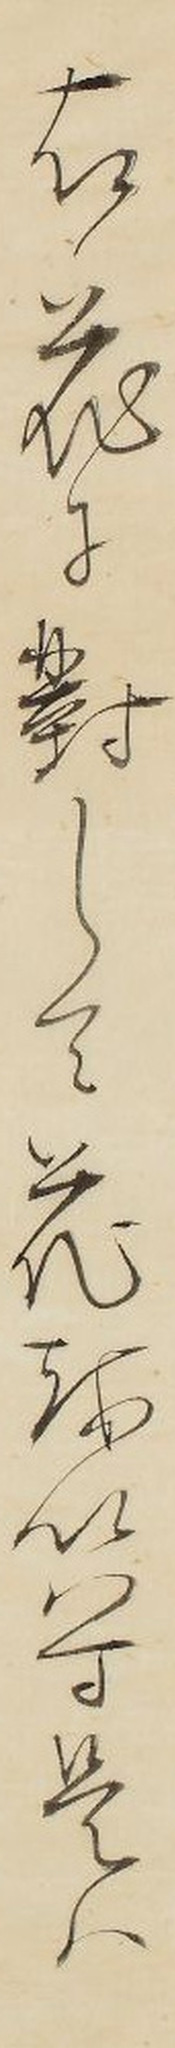右花に対して花をいはす是は
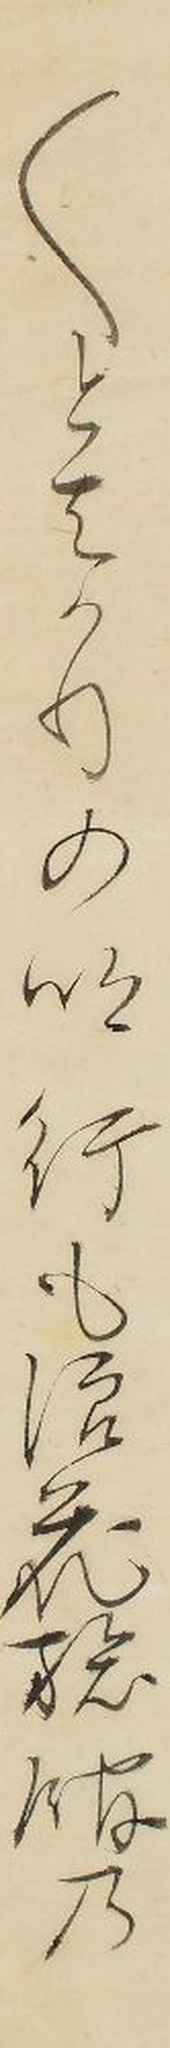〳〵とはかりの吟行も浪花旅館の
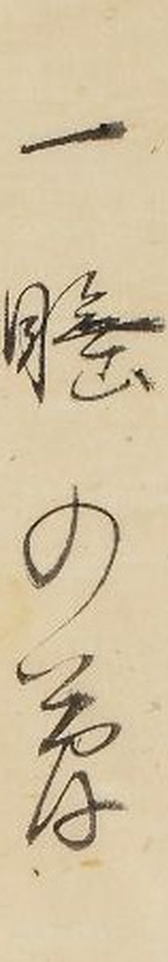一睡の夢
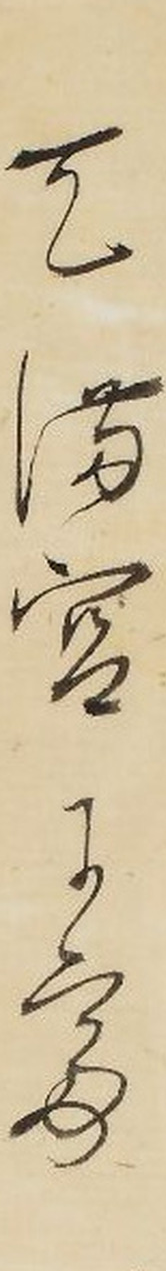天満宮にて
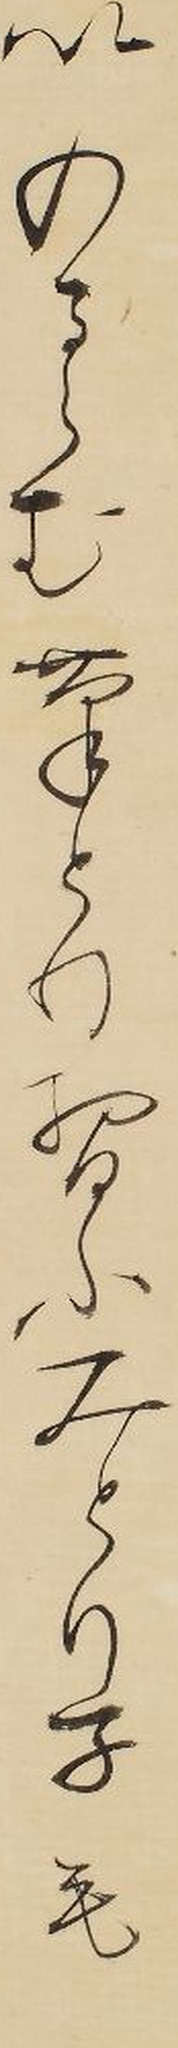いのるらむ筆とり習ふみとり子も
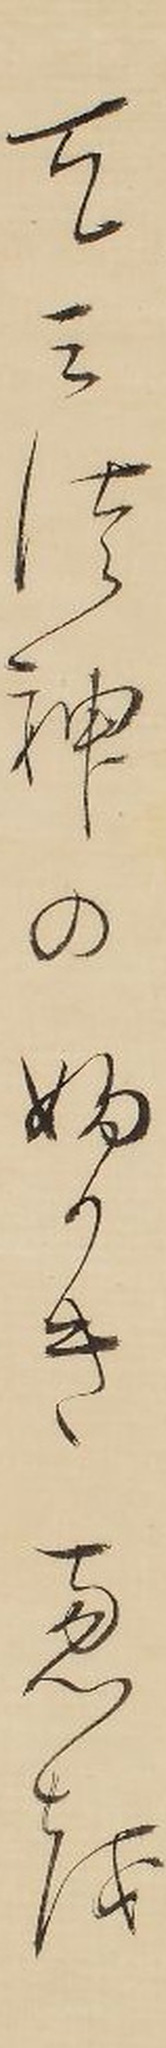天みつ神のふかき恵を
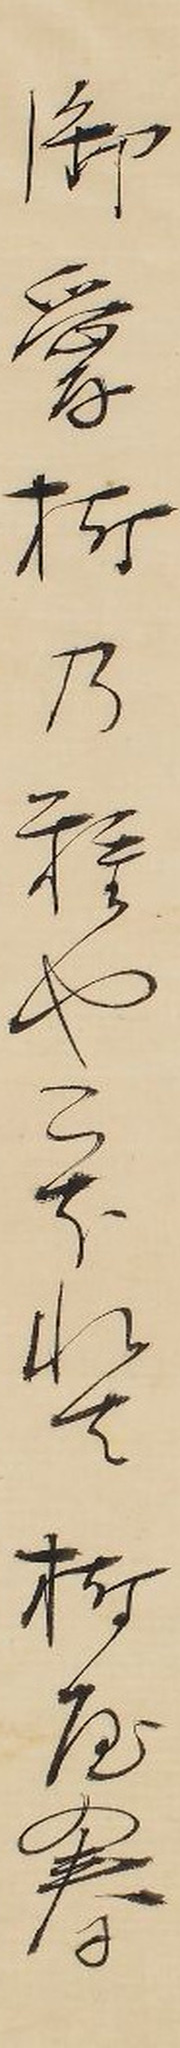御愛樹の種やこほれて樹屋の春
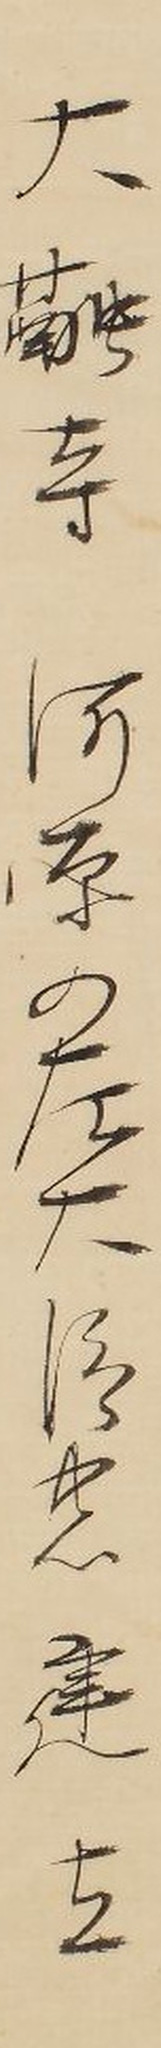大融寺河原の左大臣の建立
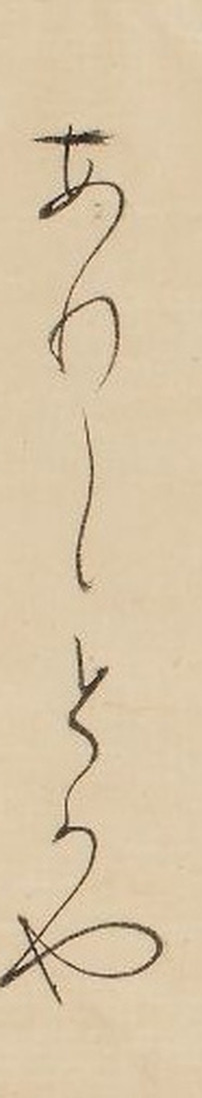ありしとかや
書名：花土産
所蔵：徳島県立図書館
